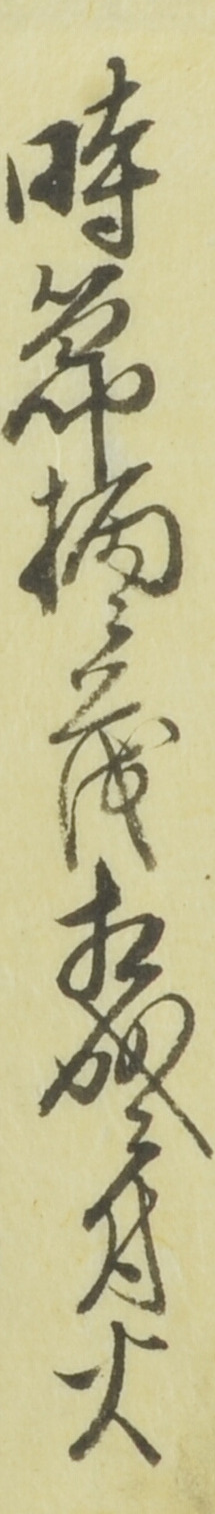時節柄ニも相成ニ付火
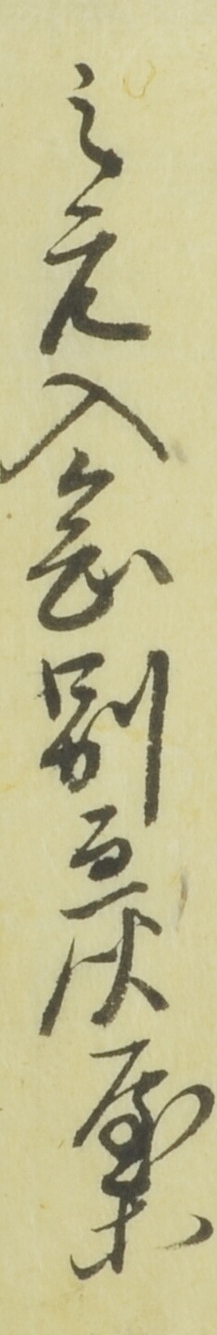之元入念別而灰屋等
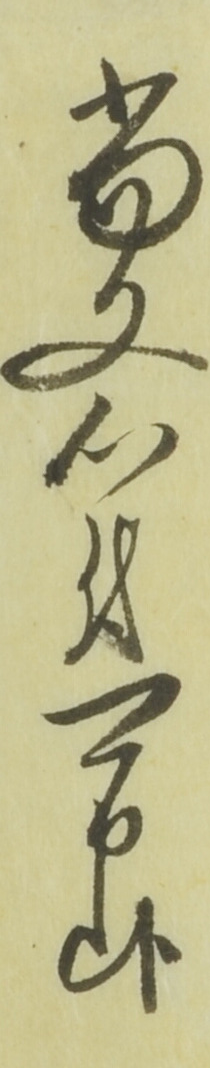尚又心付可申候
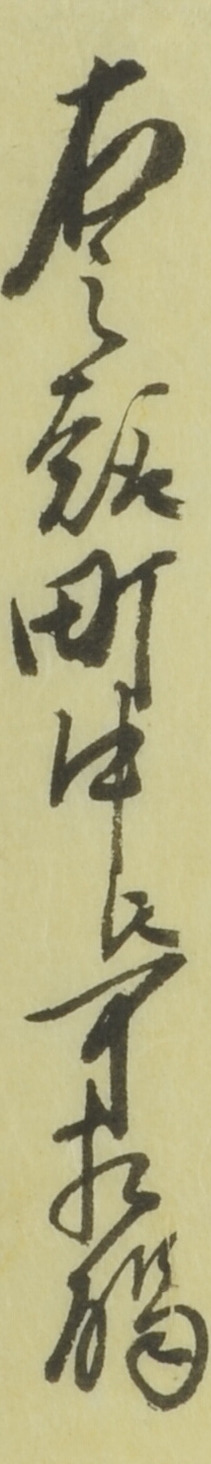右之趣町中江可相触
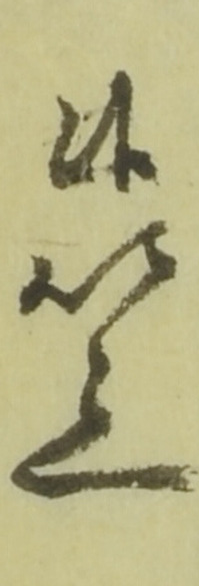候以上
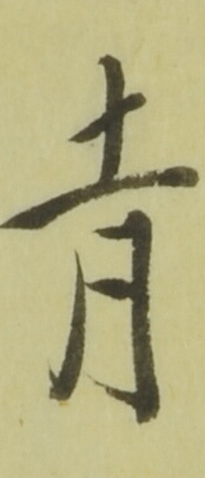十一月
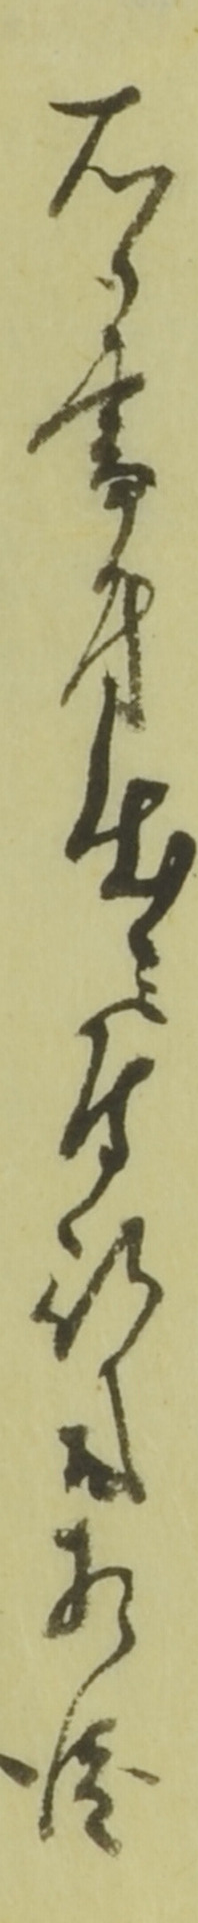右御書付出候ニ付行司相渡
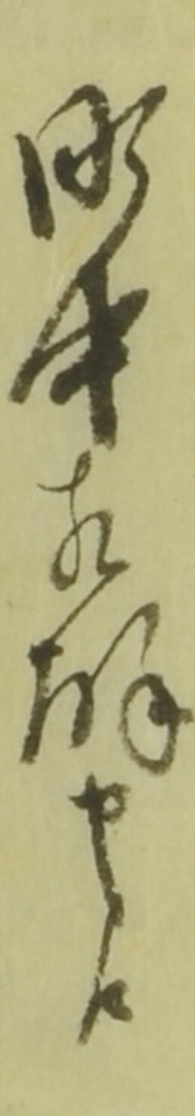町中相触申候

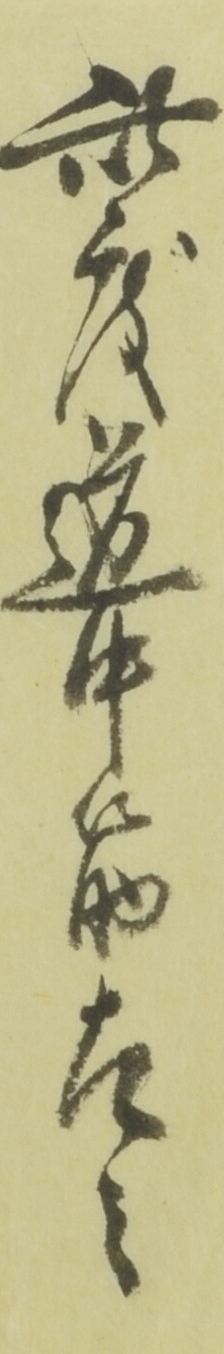此度道中筋左之
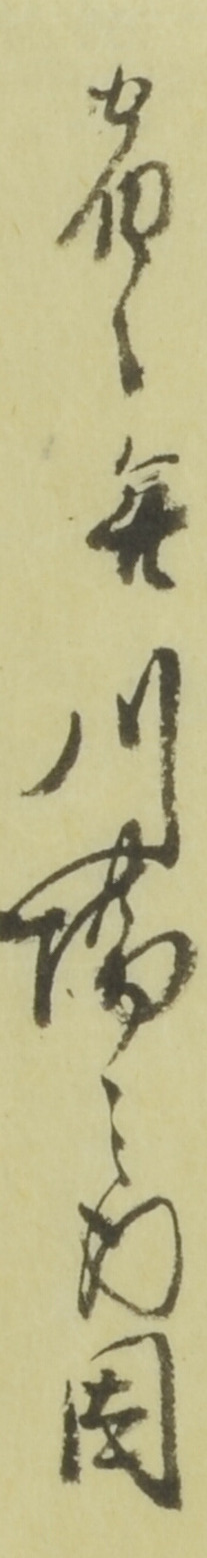宿候并川場之内困
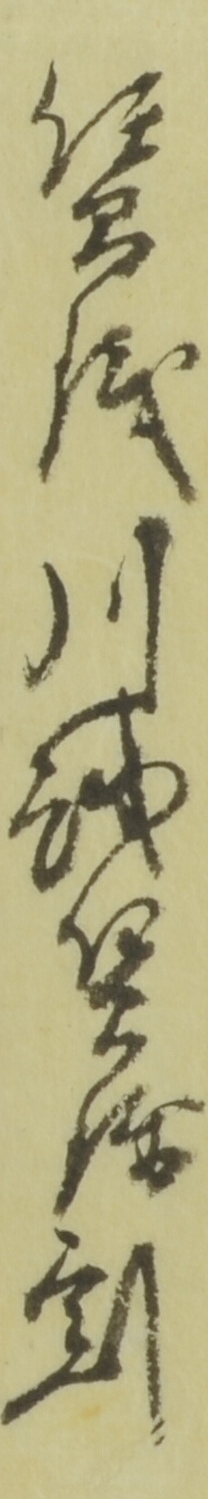賃銭川越賃銭割
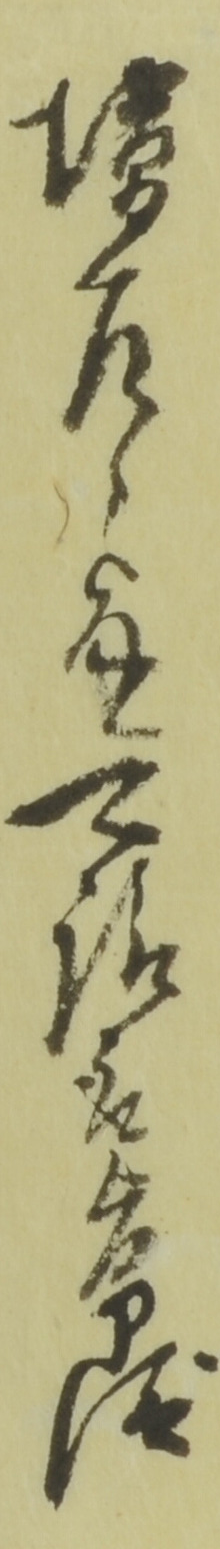増左之通可請取旨申渡
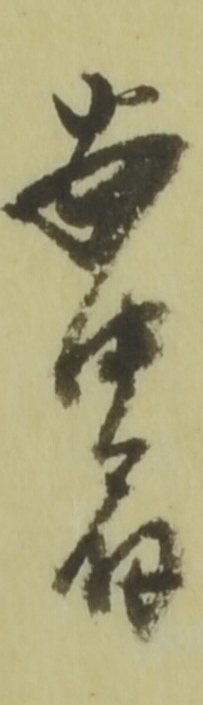安中宿
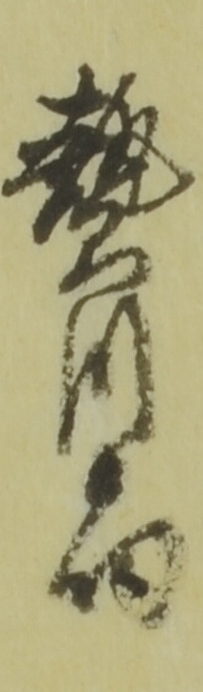贄川宿
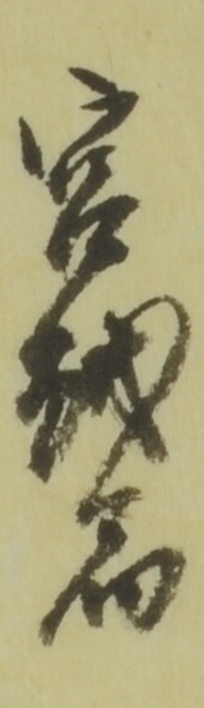宮越宿
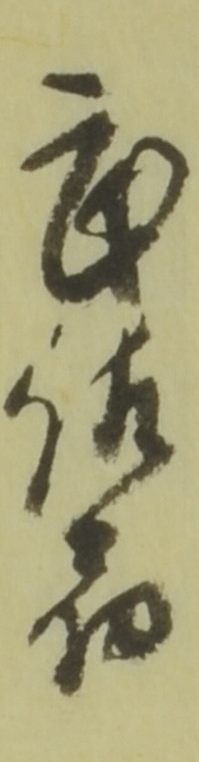武佐宿
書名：御触書御書附控
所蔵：伊那市立高遠町図書館・合同会社AMANE
